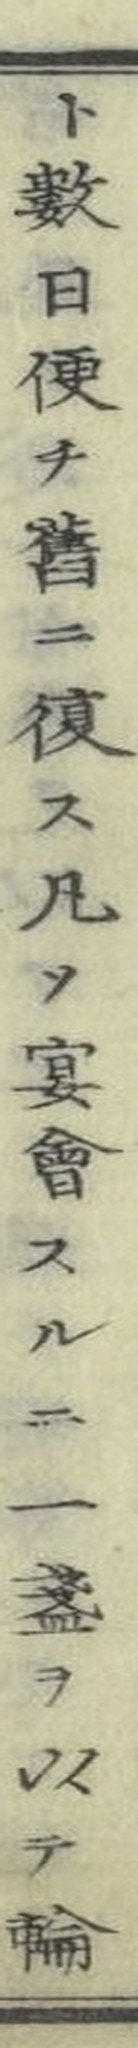ト數日便チ舊ニ復ス凡ソ宴會スルニ一盞ヲ以テ輪
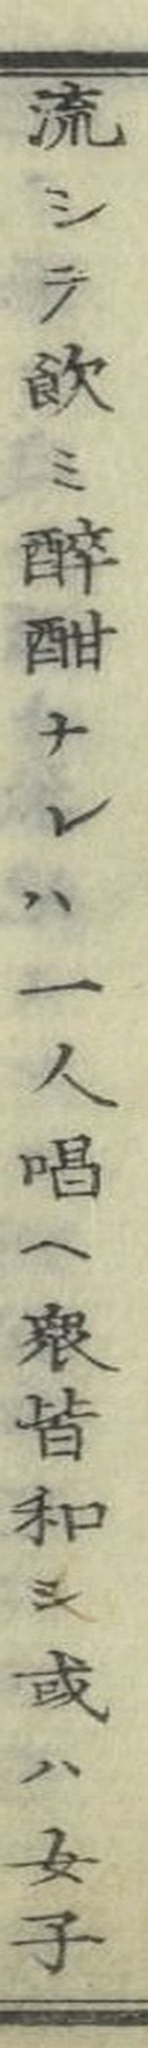流シテ飲ミ醉酣ナレハ一人唱ヘ衆皆和シ或ハ女子
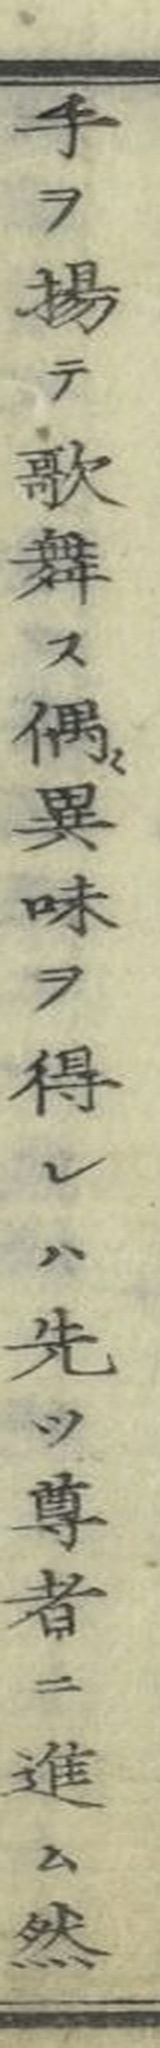手ヲ揚テ歌舞ス偶〻異味ヲ得レハ先ツ尊者ニ進ム然

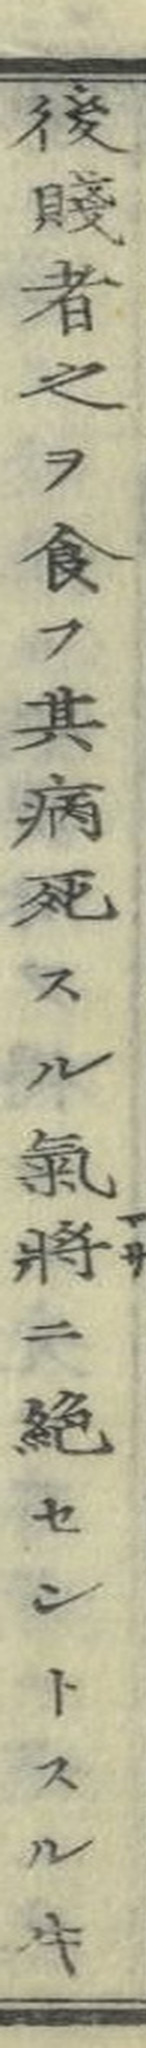後賤者之ヲ食フ其病死スル氣將ニ絕セントスルトキ
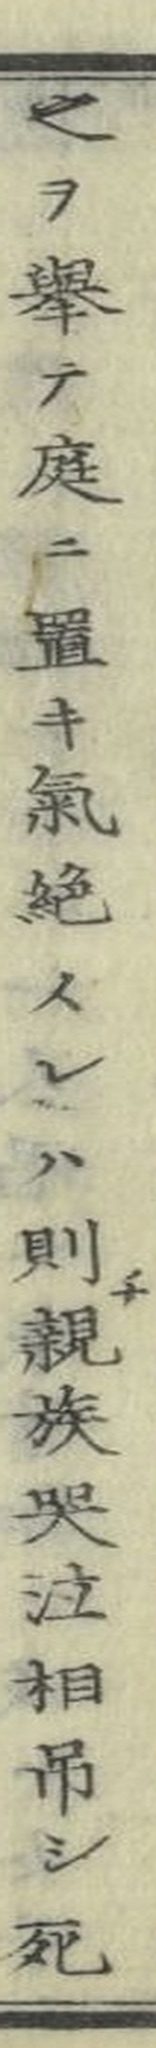之ヲ舉テ庭ニ置キ氣絶スレハ則親族哭泣相吊シ死
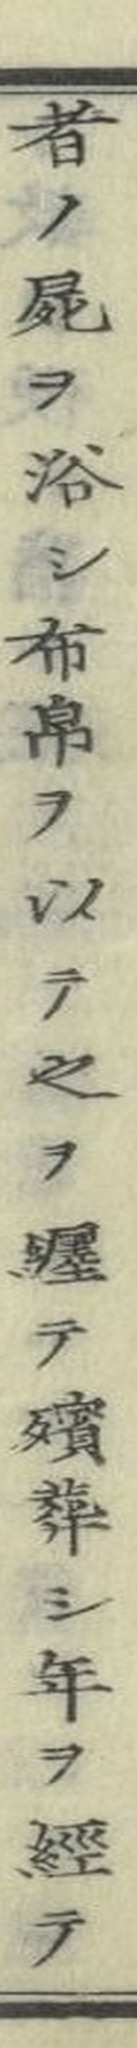者ノ屍ヲ浴シ布帛ヲ以テ之ヲ纏テ殯葬シ年ヲ經テ
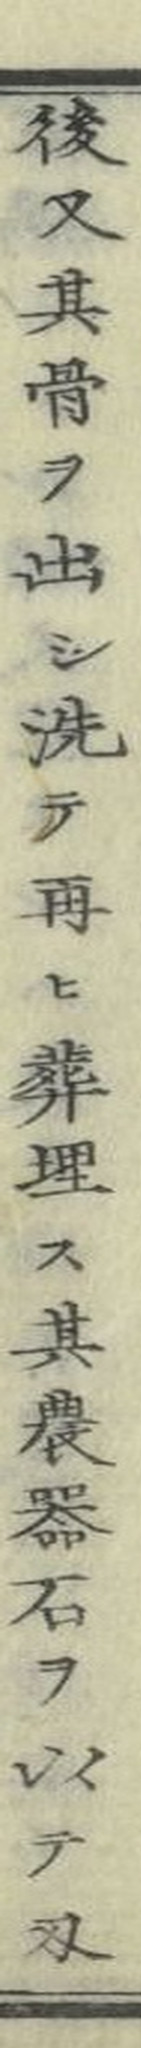後又其骨ヲ出シ洗テ再ヒ葬埋ス其農器石ヲ以テ刃
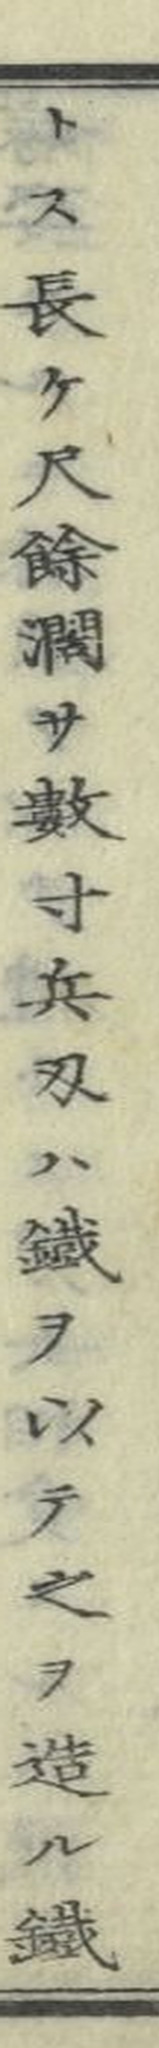トス長ケ尺餘濶サ數寸兵刃ハ鐵ヲ以テ之ヲ造ル鐵
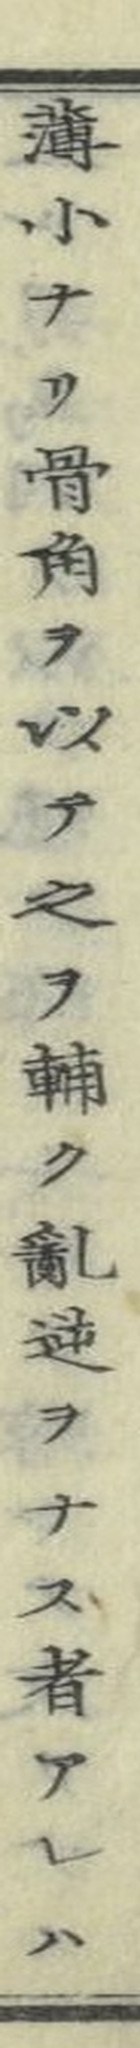薄小ナリ骨角ヲ以テ之ヲ輔ク亂逆ヲナス者アレハ
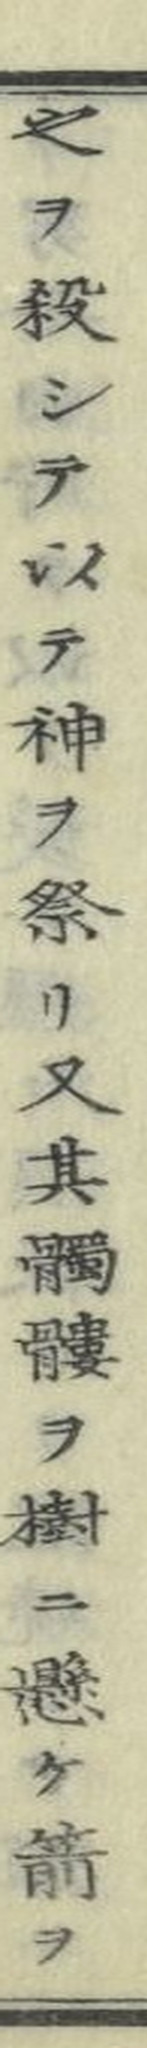之ヲ殺シテ以テ神ヲ祭リ又其髑髏ヲ樹ニ懸ケ箭ヲ
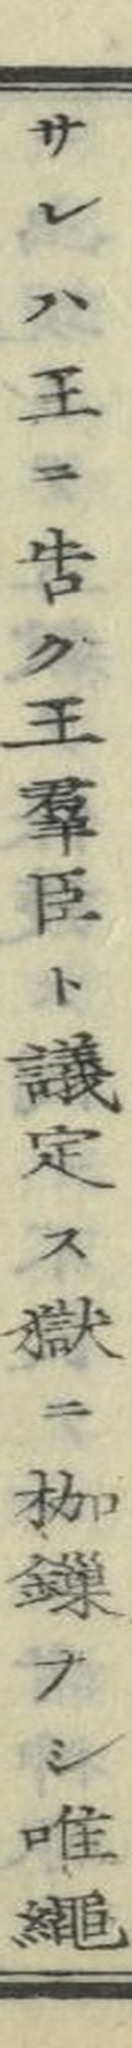サレハ王ニ告ク王羣臣ト議定ス獄ニ枷鏁ナシ唯繩
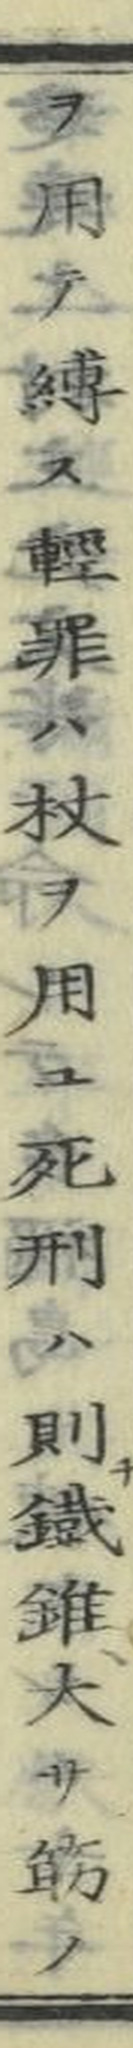ヲ用テ縛ス輕罪ハ杖ヲ用ユ死刑ハ則鐵錐、大サ節ノ
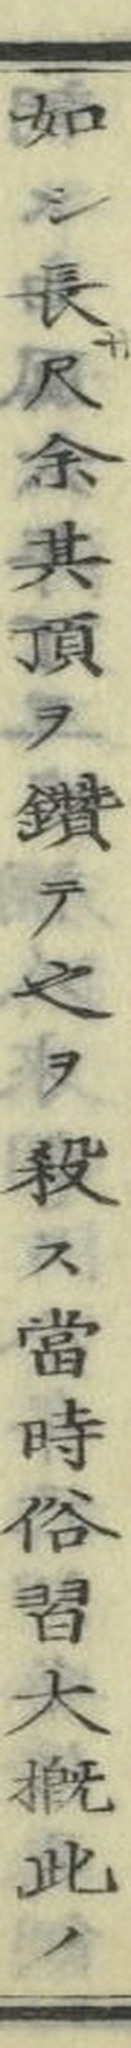如シ長尺余其頂ヲ鑽テ之ヲ殺ス當時俗習大概此ノ
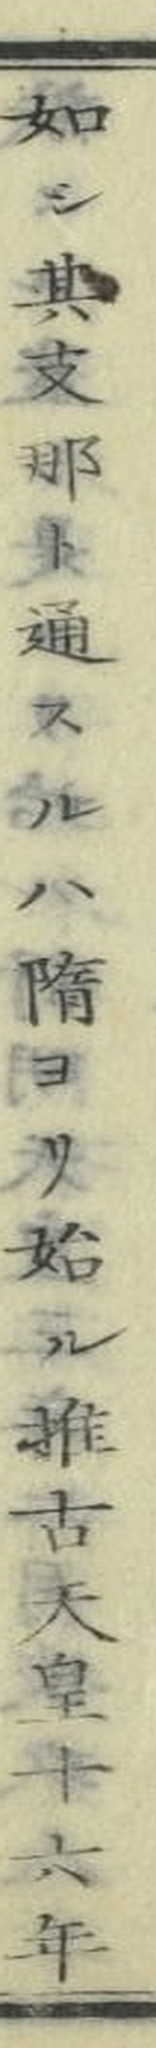如シ其支那ト通スルハ隋ヨリ始ル推古天皇十六年
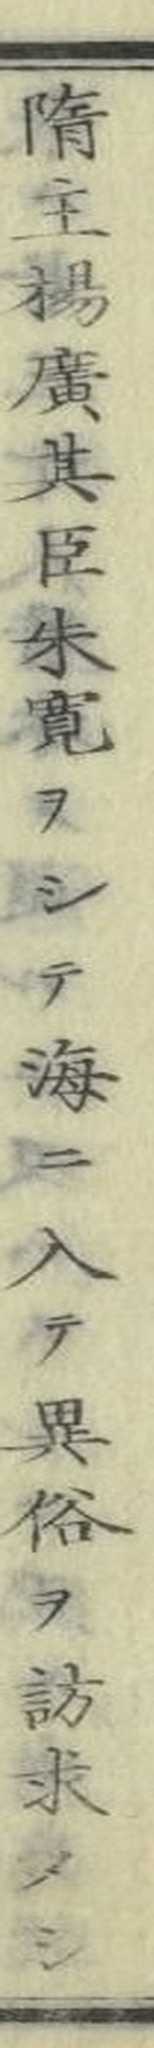隋王楊廣其臣朱寛ヲシテ海ニ入テ異俗ヲ訪求メシ
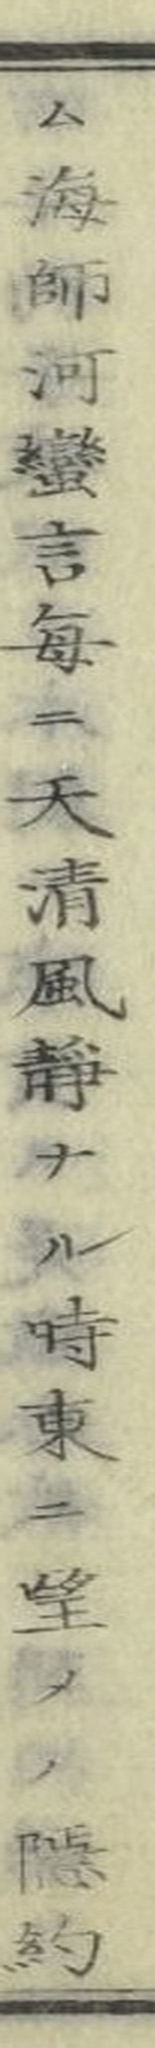ム海師河蠻言每ニ天清風靜ナル時東ニメハ約
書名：琉球藩史 一之巻
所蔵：University of the Ryukyus Library
